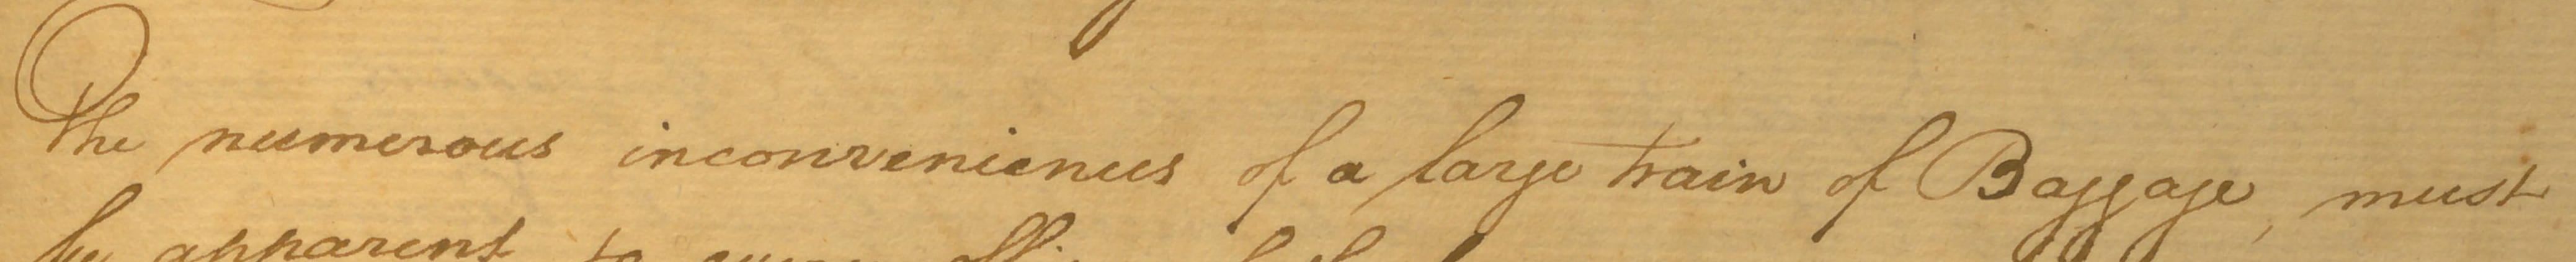The numerous inconveniences of a large train of Baggage, must
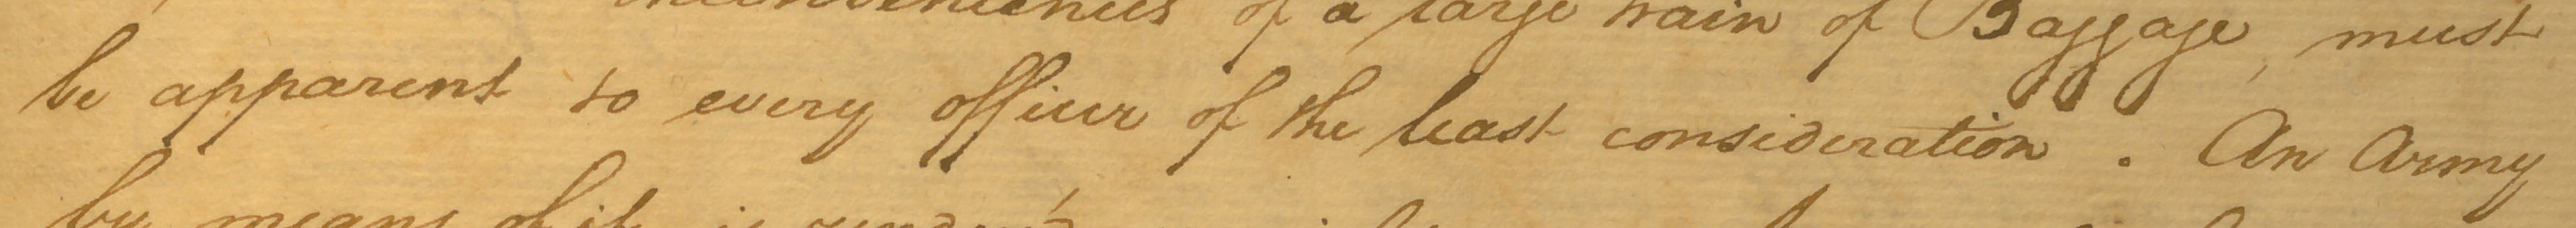be apparent to every officer of the least consideration. An Army
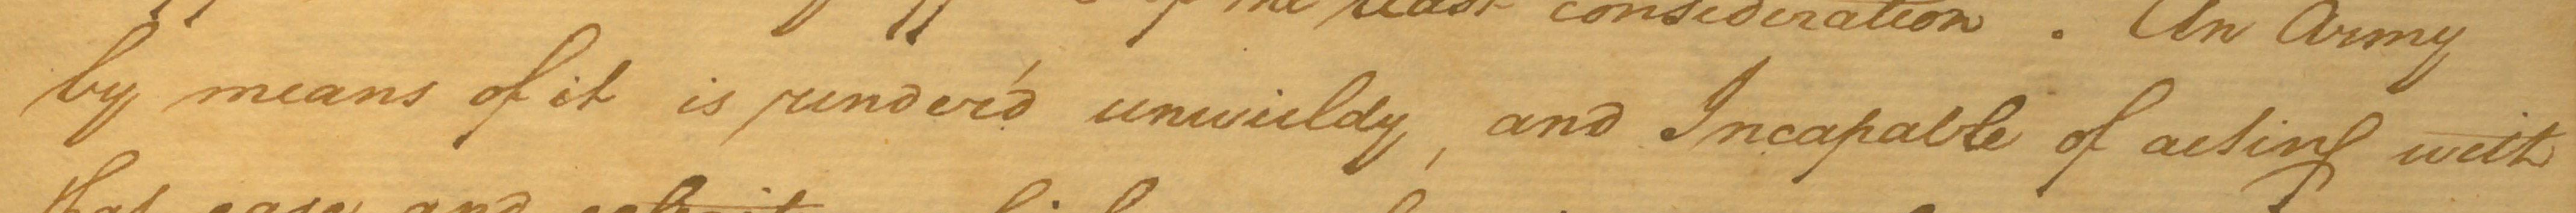by means of it is render'd unwieldy, and Incapable of acting with
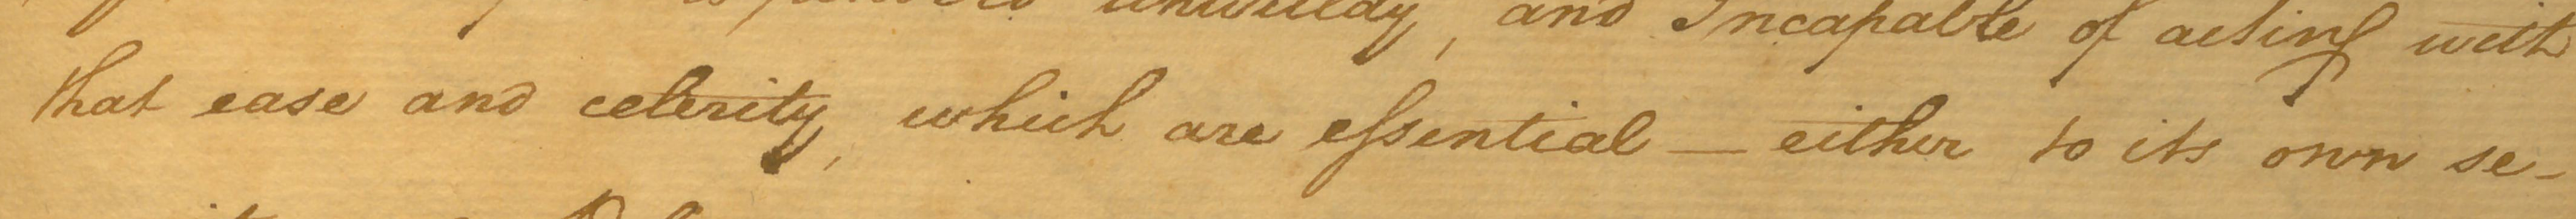that ease and celerity, which are essential- either to its own se-
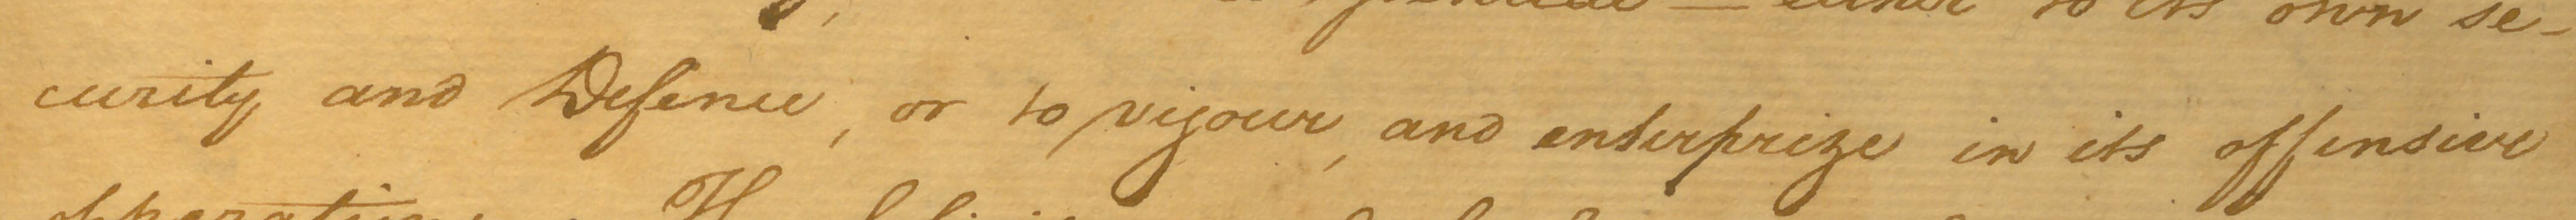curity and Defence, or to vigour and enterprize in its offensive
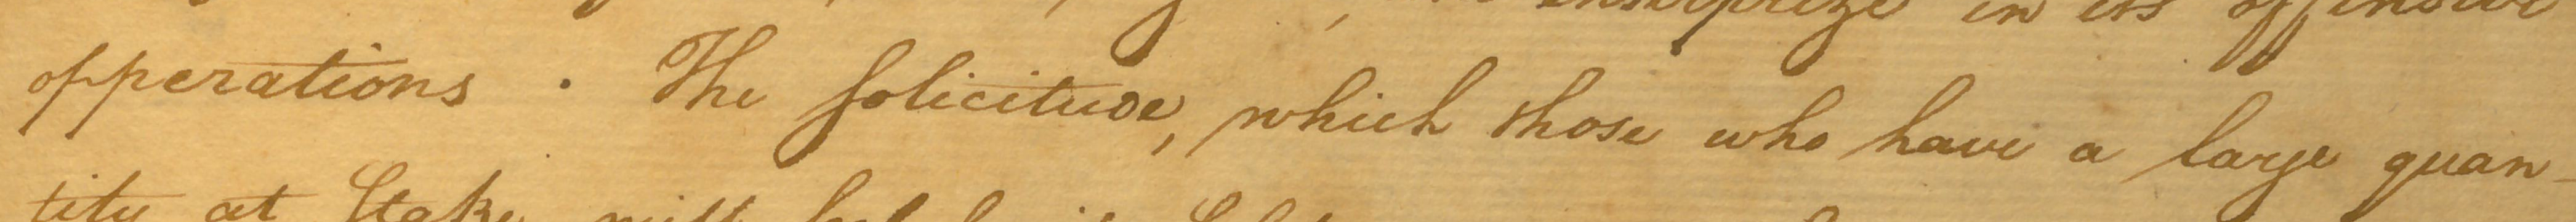opperations. The solicitude, which those who have a large quan
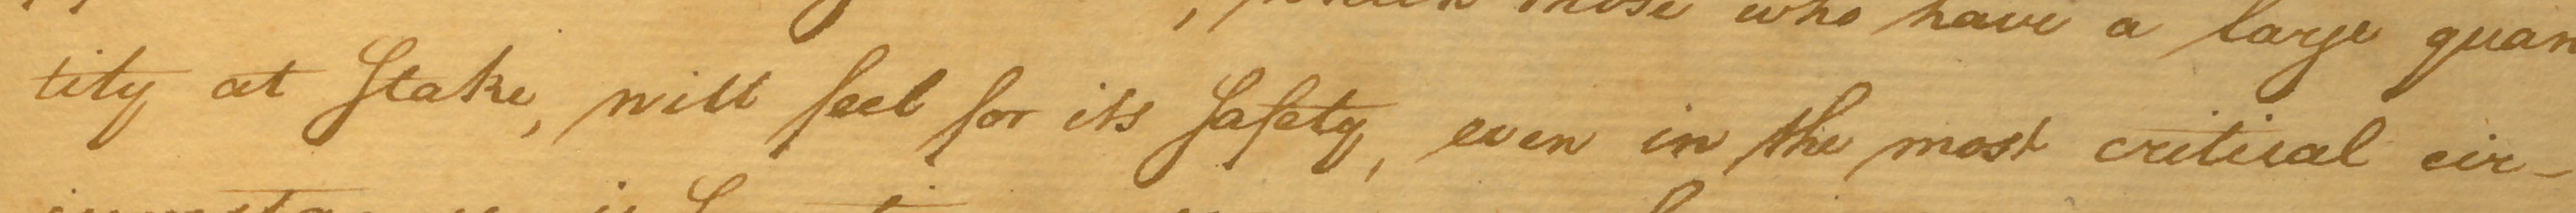tity at Stake, will feel for its safety, even in the most critical cir-
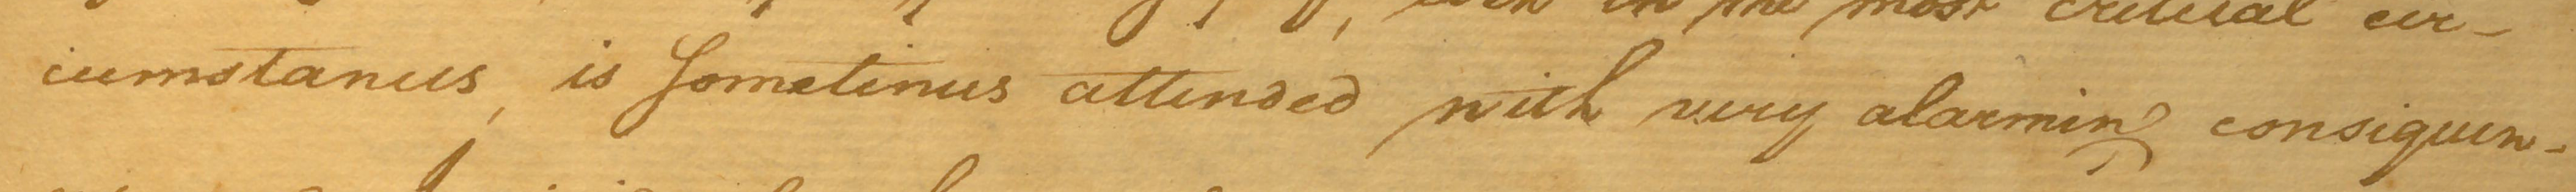circumstances, is sometimes attended with very alarming consiquen-
